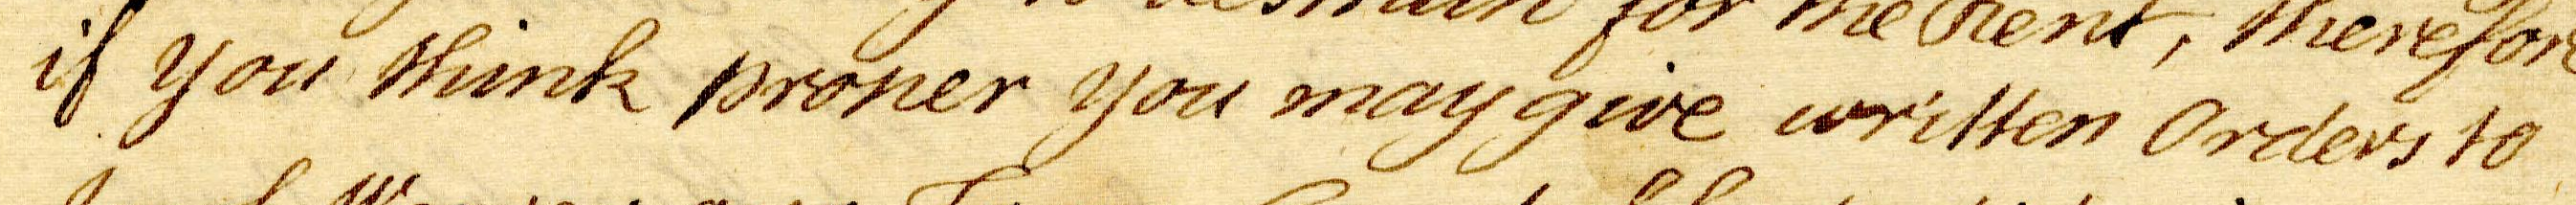if you think proper you may give written Orders to
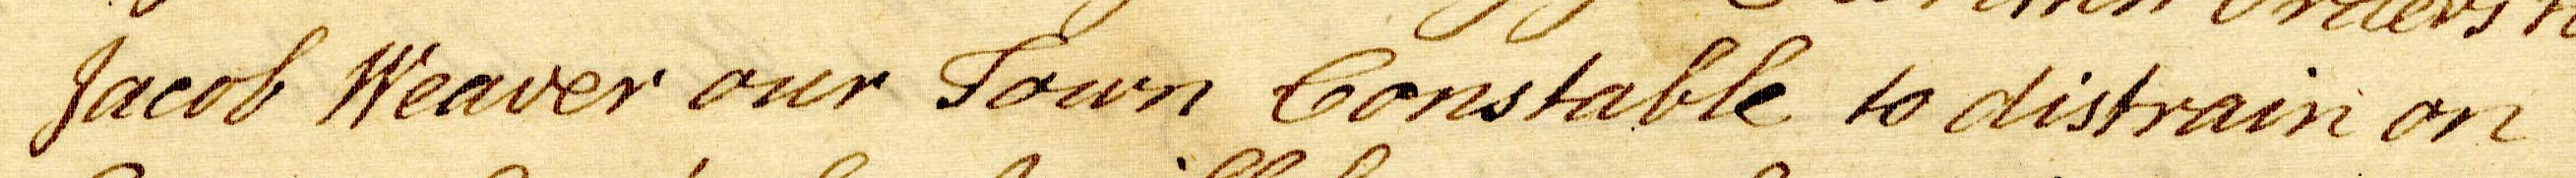Jacob Weaver our Town Constable to distrain on
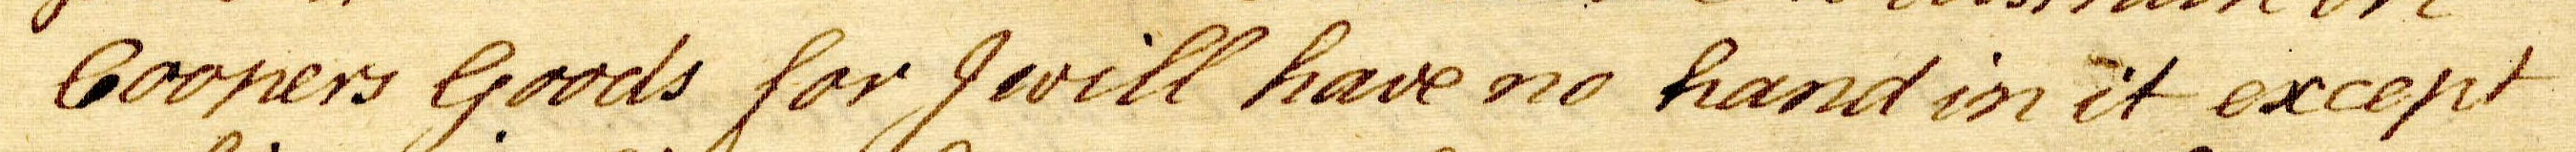Coopers Goods for I will have no hand in it except
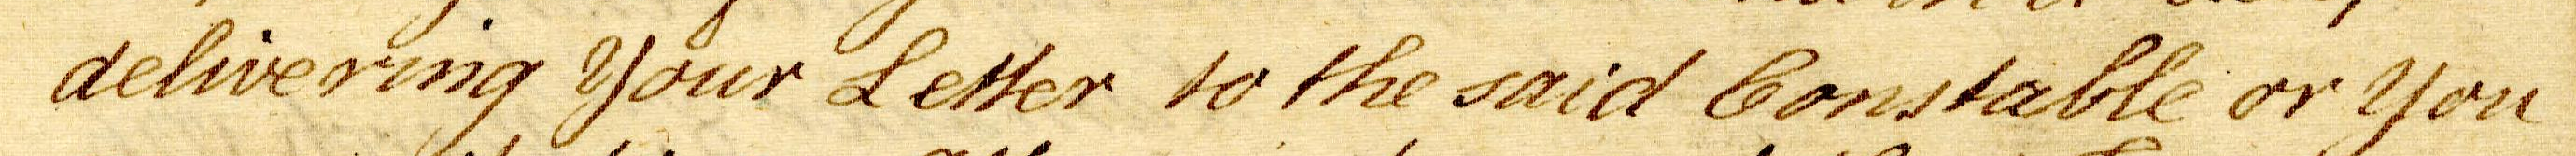delivering Your Letter to the said Constable or You
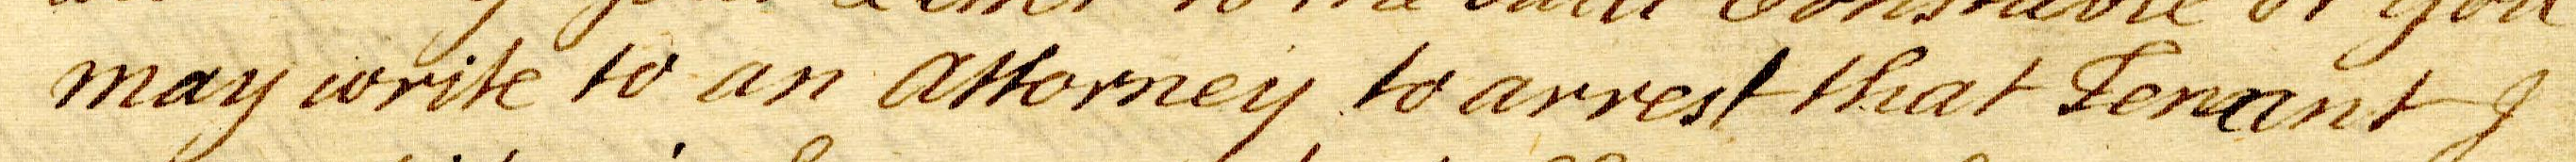may write to an Attorney to arrest that Tenant I
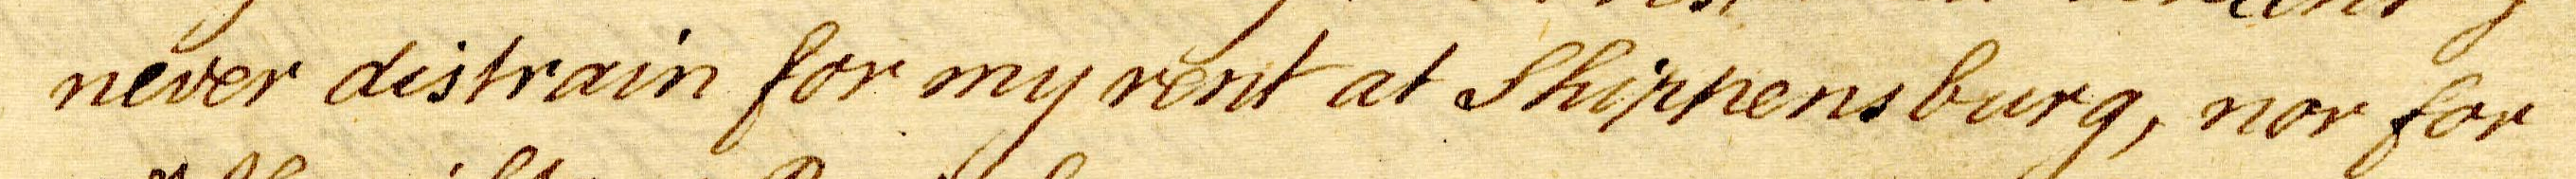never distrain for my rent at Shippensburg, nor for
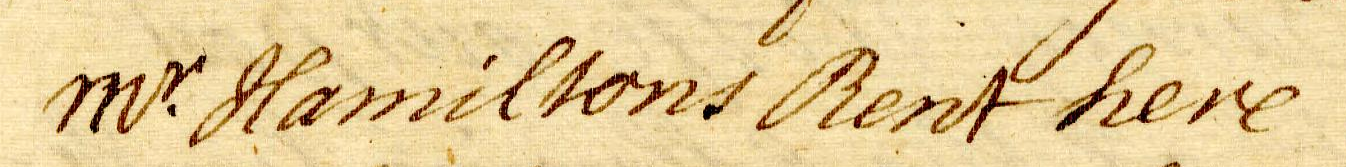M^r. Hamiltons Rent here
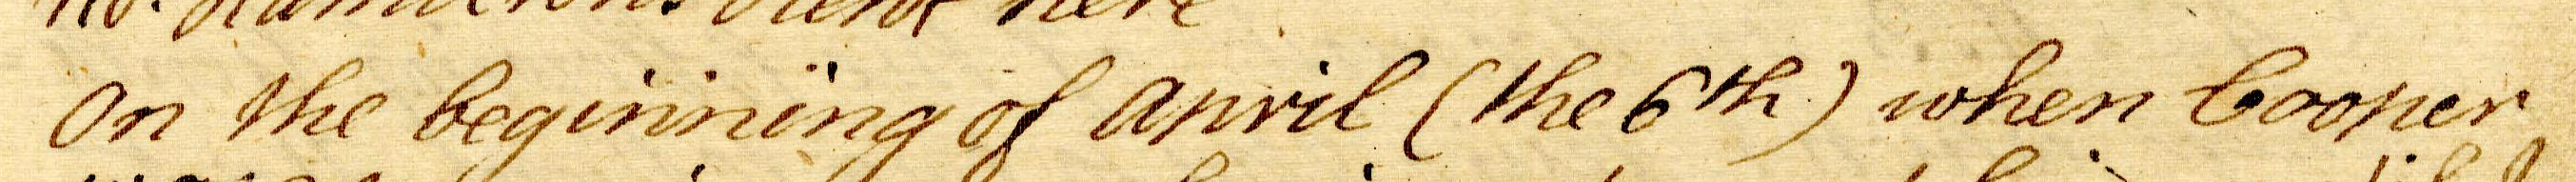On the beginning of April (the 6^th) when Cooper
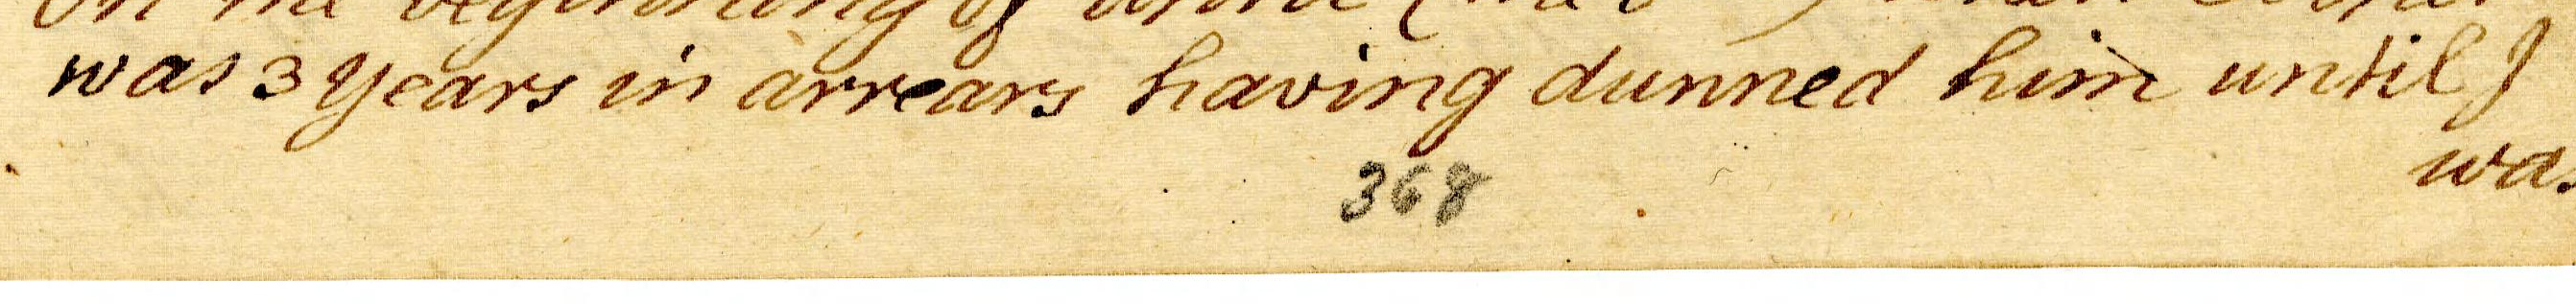was 3 years in arrears having dunned him until I
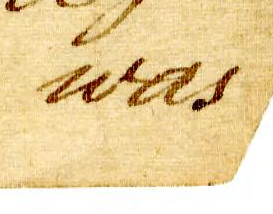was
